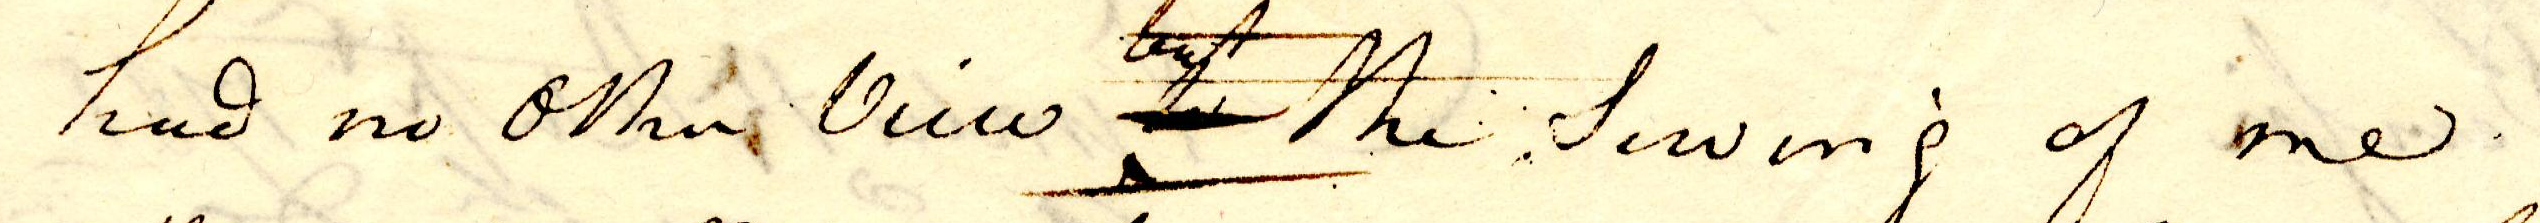had no Other View but the Serving of me
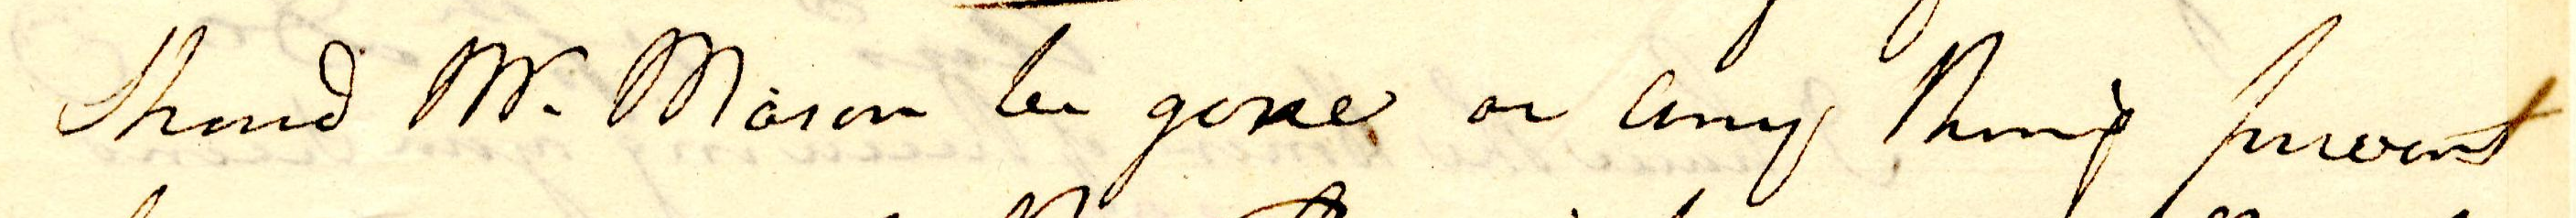Should M^r. Mason be gone or Any thing prevent
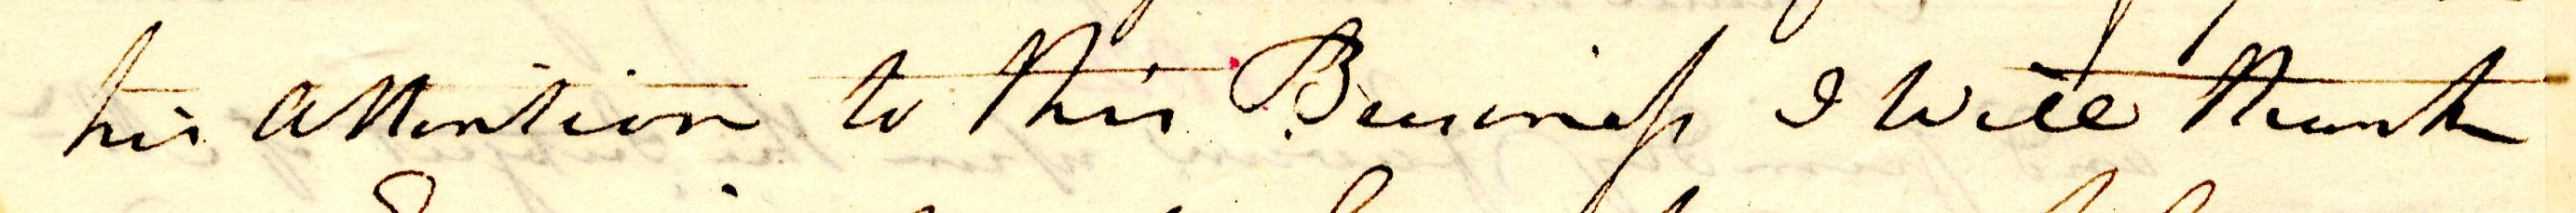his Attention to this Business I will thank
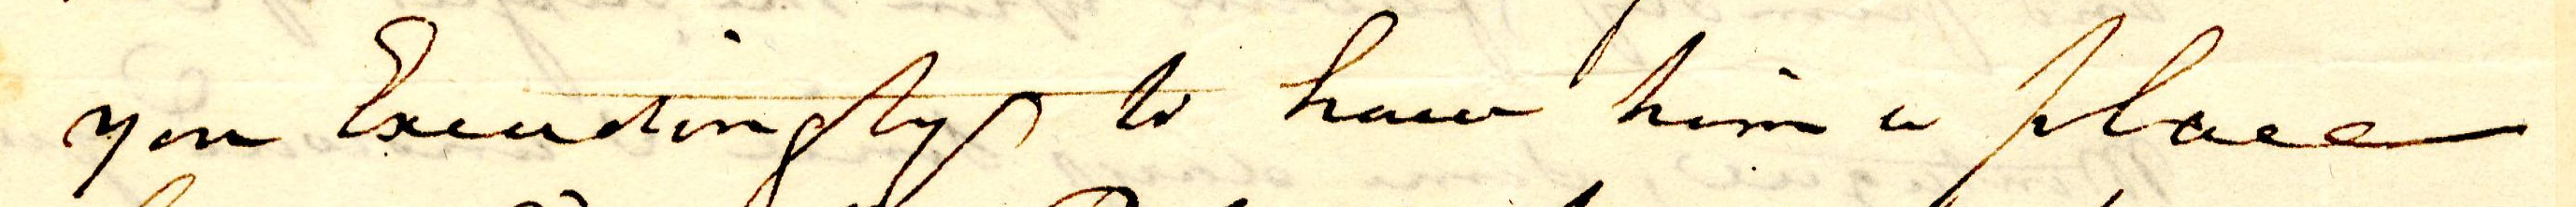you Exceedingly to have him a place
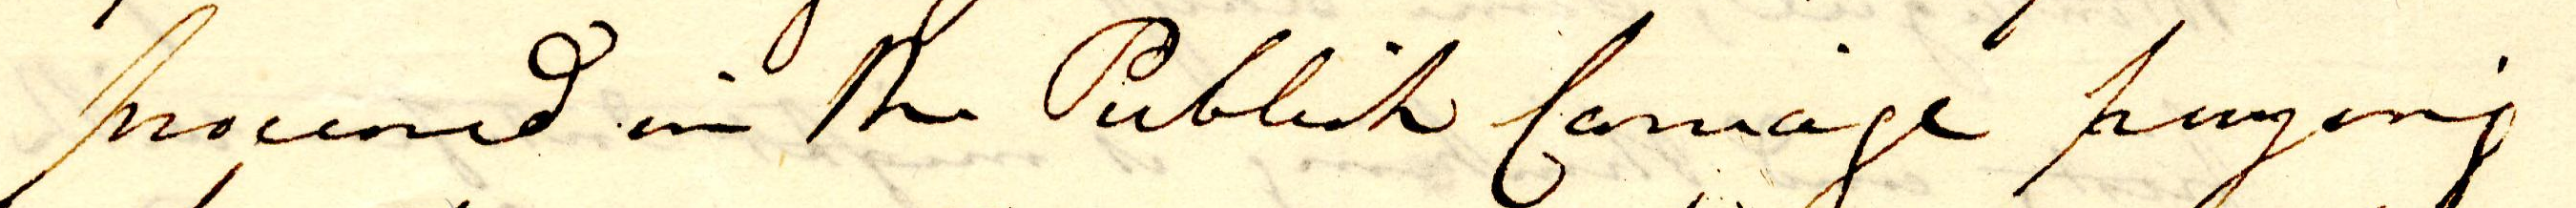procured in the Public Carriage paying
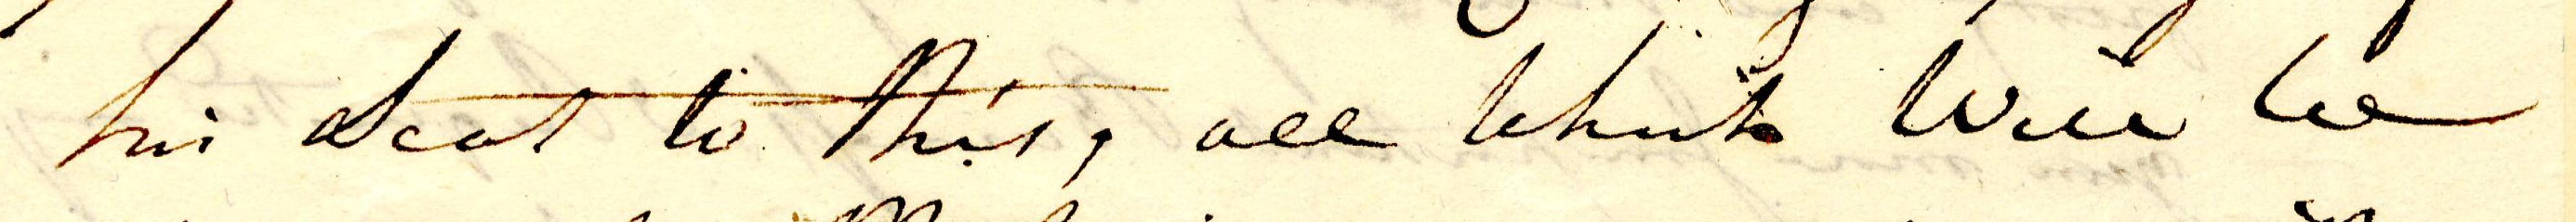his Seat to this, all Which Will be
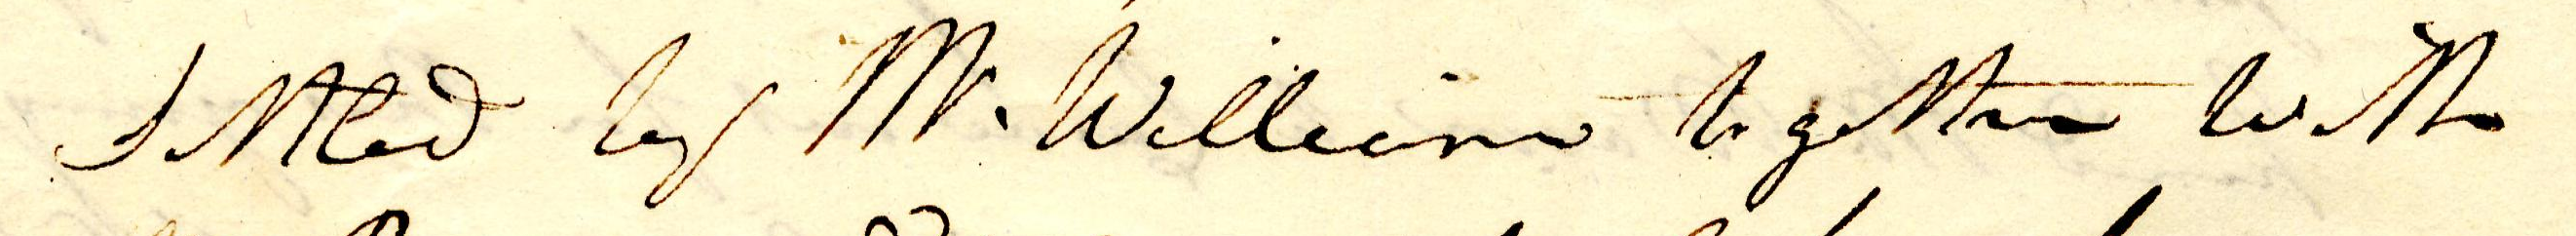Settled by M^r. Williams together with
